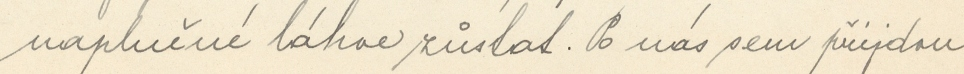naplněné láhve zůstat. Po nás sem přijdou
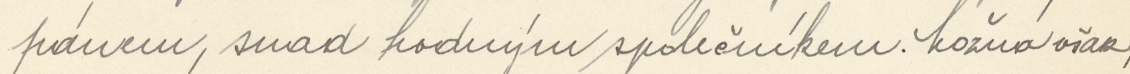pánem, snad hodným společníkem. Možná však,
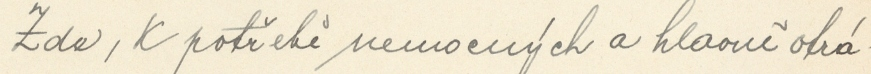Zde, k potřebě nemocných a hlavně otrá-
